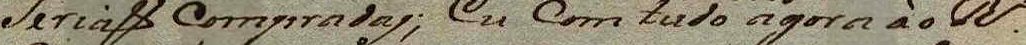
Seriaõ compradas; eu comtudo agora ào R.o
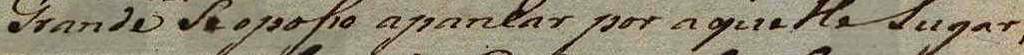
Grande se o posso apanhar por aquelle lugar,
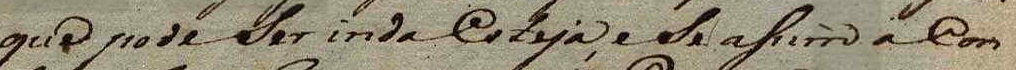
que pode Ser inda Esteja e Se assim aCon
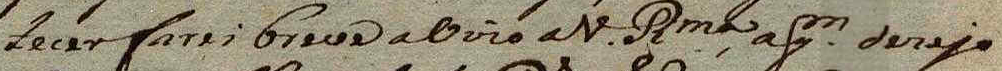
tecer farei breve alivio a V. R.ma, a q.m dezejo
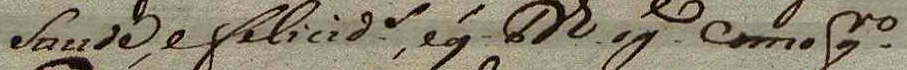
saude, e felicid.e, e q̄ Ds o g.e como q.ro
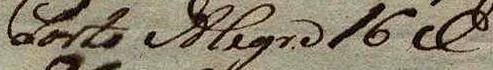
Porto Alegre 16 d̄
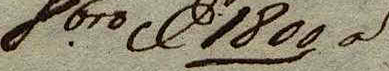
8.bro d̄ 1800 ā
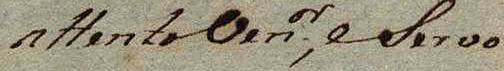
attento Ven.or, e Servo
